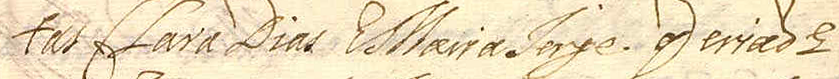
tas Clara Dias E Maria Iorge. q̄ criaõ E
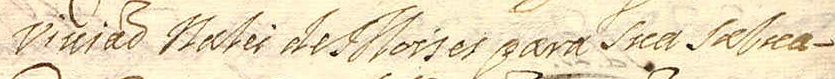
viuiaõ na lei de Moises para sua salua
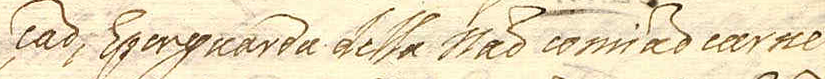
ção, E per guarda della naõ comião carne
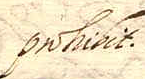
prohibit.
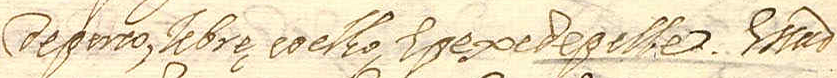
de porco, lebre, coelho, E pexe de pelle. E não
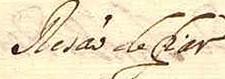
Resaõ de fiar
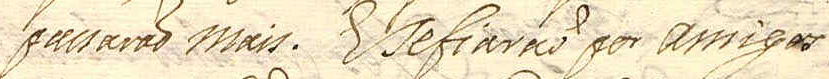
passarão mais. E se fiaraõ por amigos
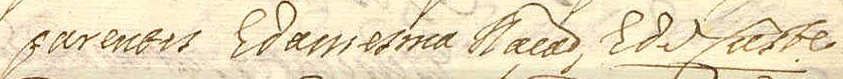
parentes E da mesma Naçaõ, E do Cust.e
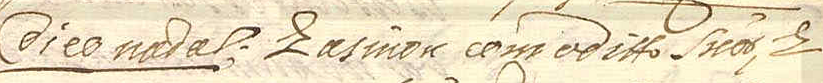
dice nada C; E assinou com o ditto Sn̄or E
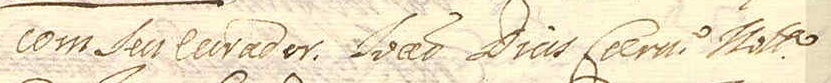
com seu curador, Ioaõ Dias Carv.o Not.ro
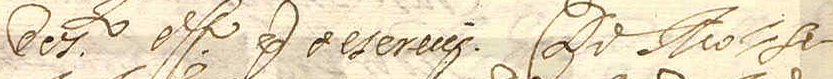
do s.to off.o q̄ o escreuj. Do Reo // se
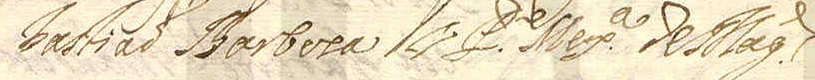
bastiaõ Barboza // P.o Mex.a de Mag.es
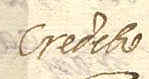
Credito
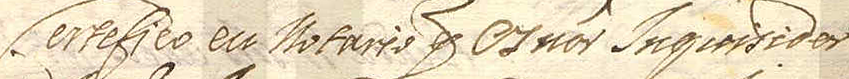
Certefico eu Notario q̄ o Snõr Inquisidor
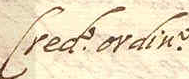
Cred.o ordin.o
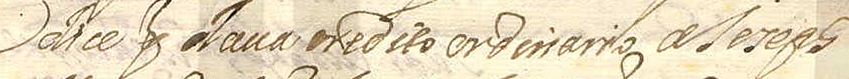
dice q̄ daua credito ordinario a Iozeph
